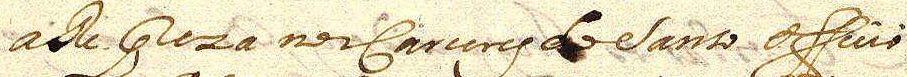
a Re. preza nos Carceres do Santo officio
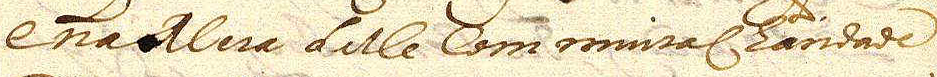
e na Meza delle Com muita Charidade
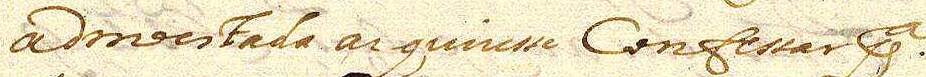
admoestada as quizesse Confessar pa.
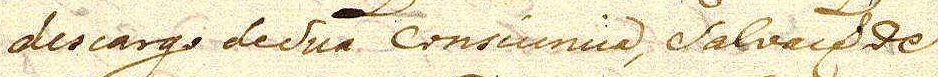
descargo de Sua consciencia, Salvaçaõ de
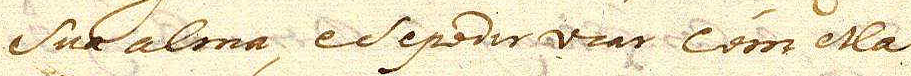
Sua alma, e se poder vzar Com ella
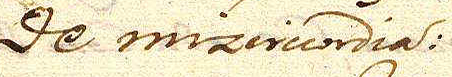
de mizericordia:
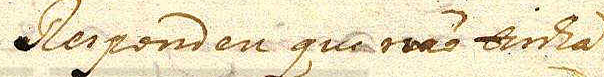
Respondeu que naõ tinha
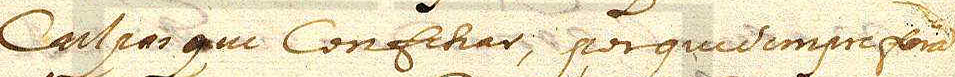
Culpas que Confessar, porque sempre fora
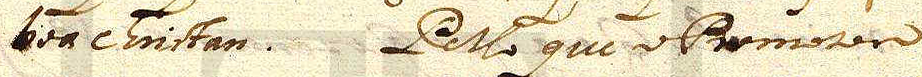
boa christan. Pello que o Promotor
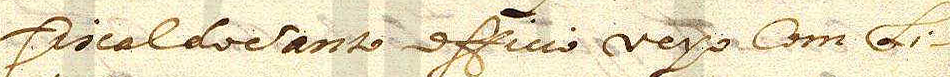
fiscal do santo officio veyo Com Li
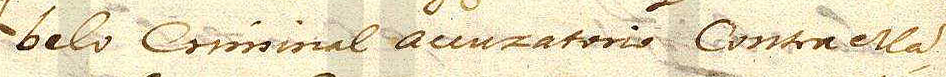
belo Criminal accuzatorio Contra ella,
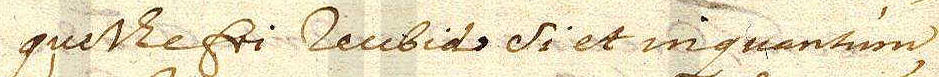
que lhe foi Recebido si et in quantum,
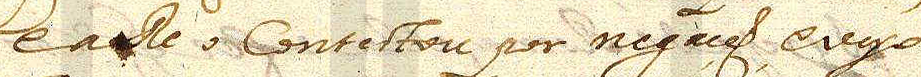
e a Re o Contestou por negaçaõ, e veyo
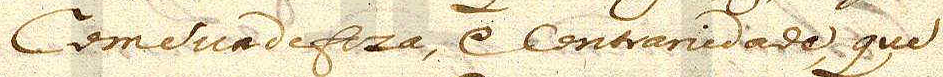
Com sua defeza, e contrariedade, que
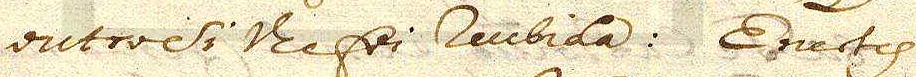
outrosi lhe foi Recebida: E nestes
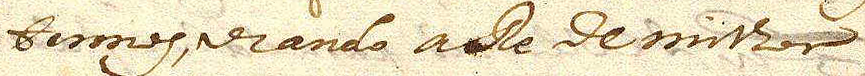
termos, uzando a Re de milhor
